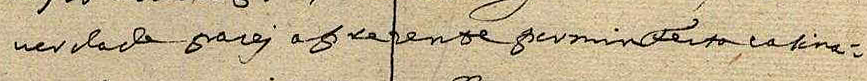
uerdade pasej a prezente por min Feita e asina
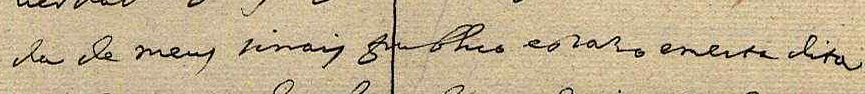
da de meus sinais publico e Razo en esta dita
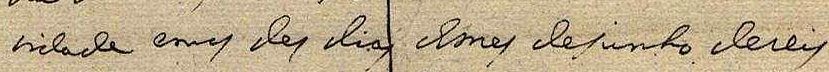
cidade e mes des dias do mes de junho de seis
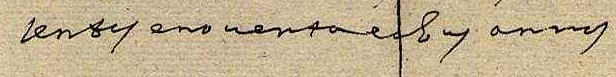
sentos e nouenta e dous annos
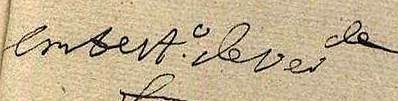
em test.o de verde
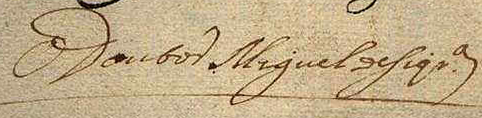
O Doutor Miguel de siqr.a
